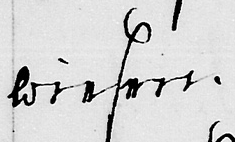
wiesen.
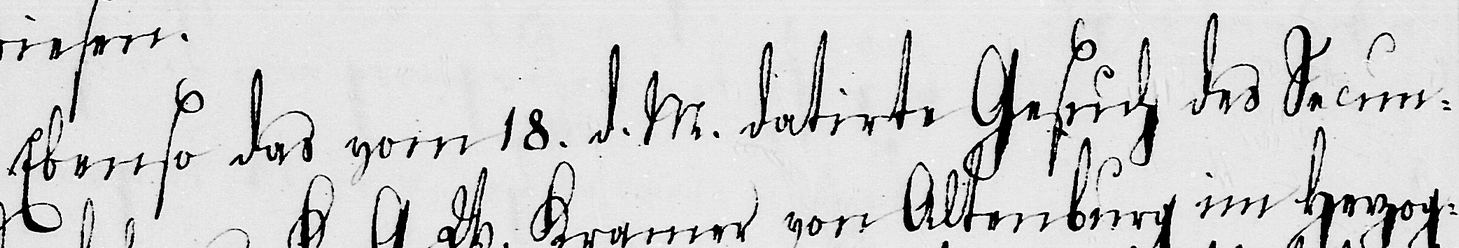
Ebenso das vom 18. d. M. datirte Gesuch des Secun¬
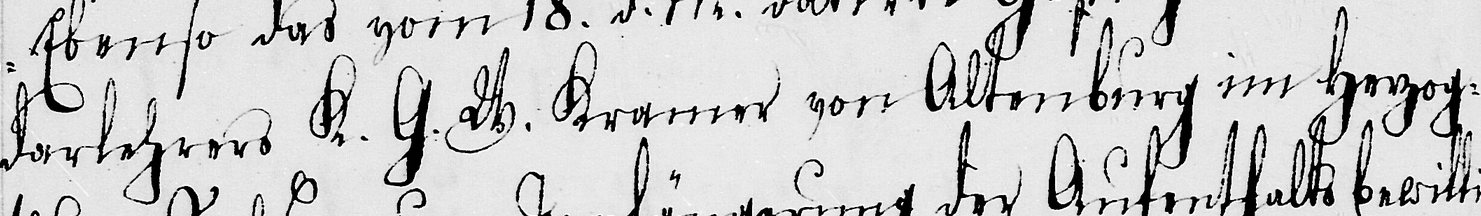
darlehrers K. G. W. Kramer von Altenburg im Herzog¬
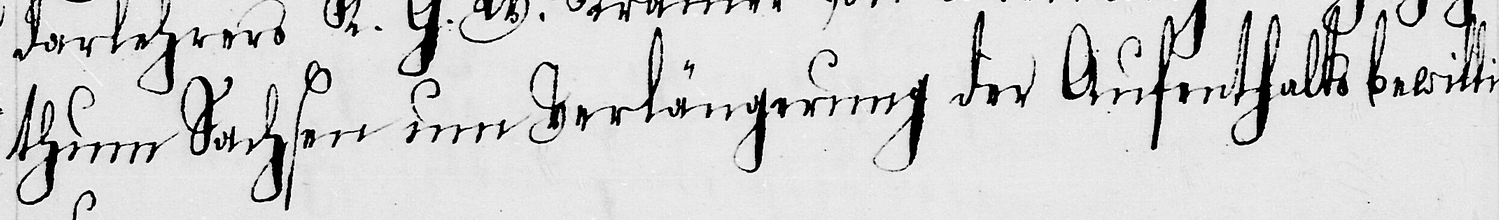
thum Sachsen um Verlängerung der Aufenthaltsbewill¬
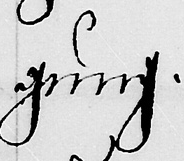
igung.
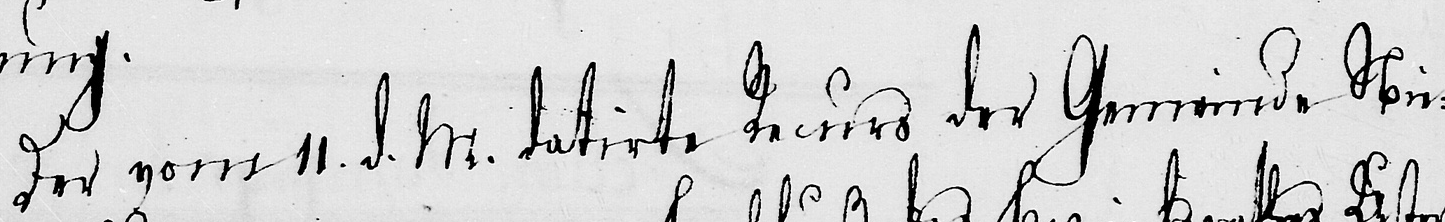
Der vom 11. d. M. datirte Recurs der Gemeinde Nie¬
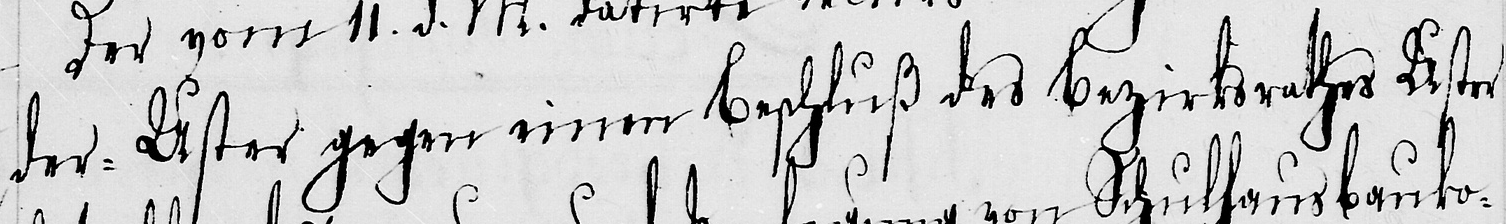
der-Uster gegen einen Beschluß des Bezirksrathes Uster
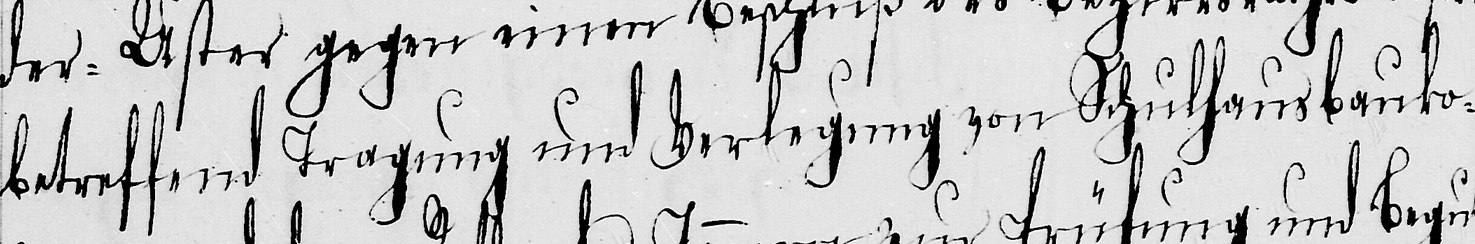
betreffend Tragung und Verlegung von Schulhausbauko¬
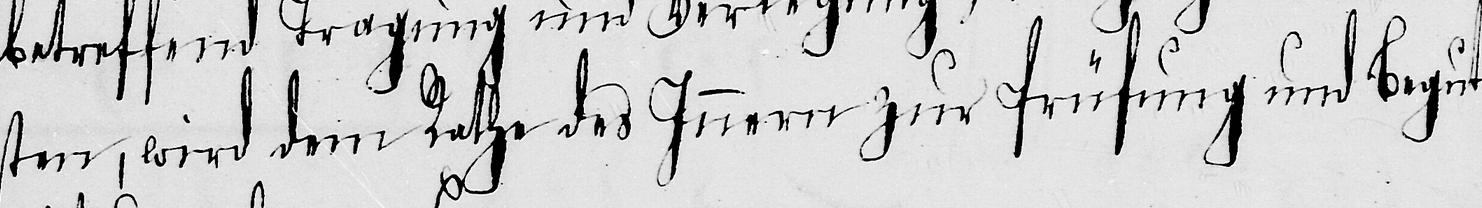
sten, wird dem Rathe des Innern zur Prüfung und Begu¬
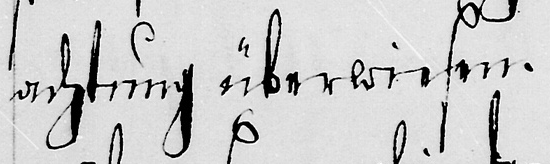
tachtung überwiesen.
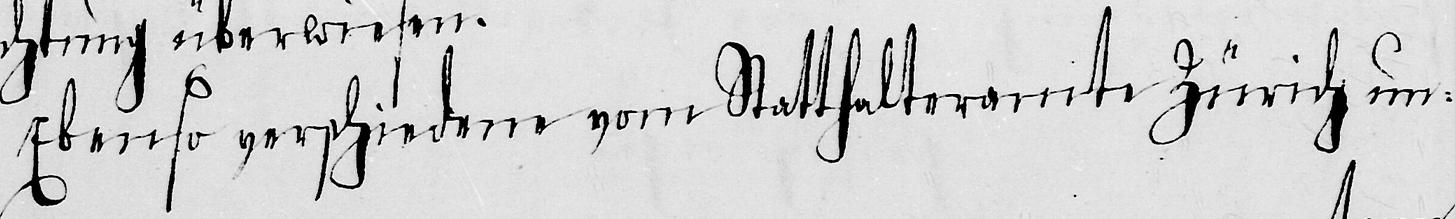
Ebenso verschiedene vom Statthalteramte Zürich un-
